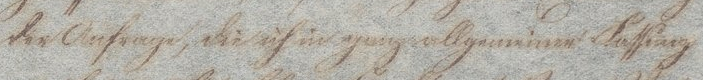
der Anfrage, die ich in ganz allgemeiner Fassung
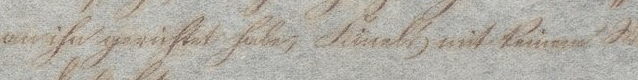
an ihn gerichtet habe, Kinel's mit keinem Worte
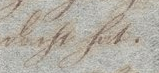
gedacht hat.
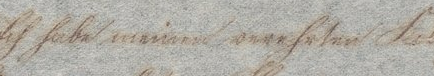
Ich habe meinen verehrten Kollegen,
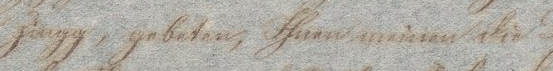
Zingg, gebeten, Ihnen meinen die Be-
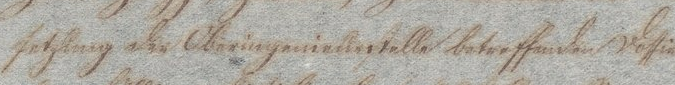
setzung der Oberingenieurstelle betreffenden Dossier
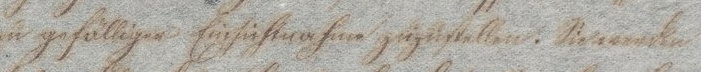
zu gefälliger Einsichtnahme zuzustellen. Sie werden
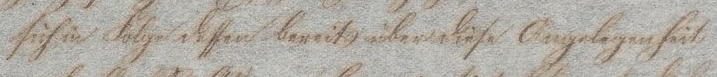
sich in Folge dessen bereits über diese Angelegenheit
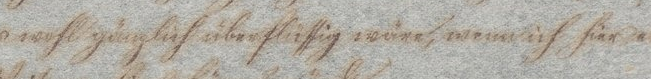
wohl gänzlich überflüssig wäre, wenn ich hier
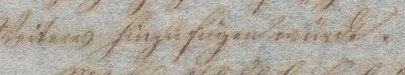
Weiteres hinzufügen würde.
